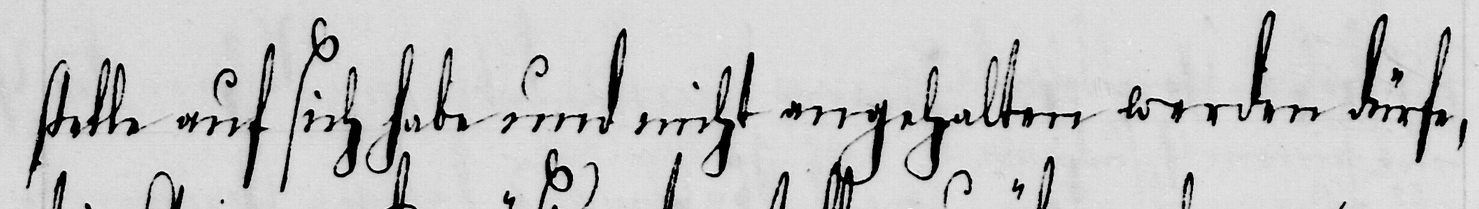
telle auf sich habe und nicht angehalten werden dürf¬
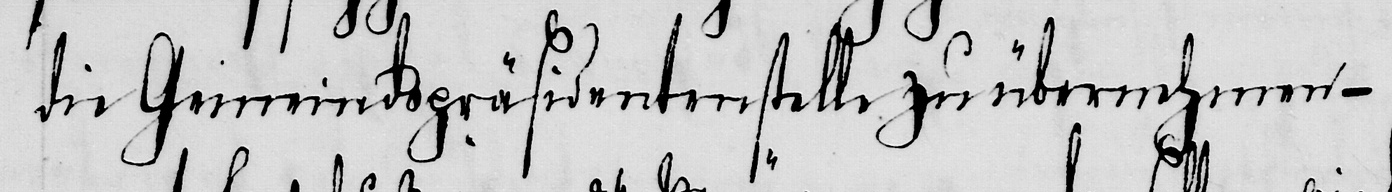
die Gemeindspräsidentenstelle zu übernehmen –
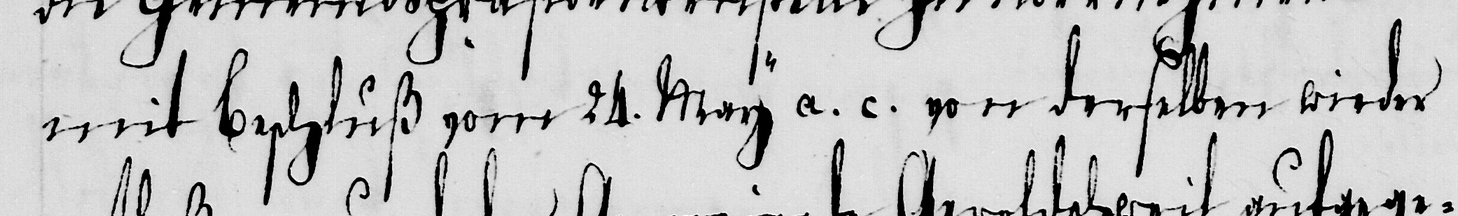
mit Beschluß vom 24. May a. c. von derselben wieder
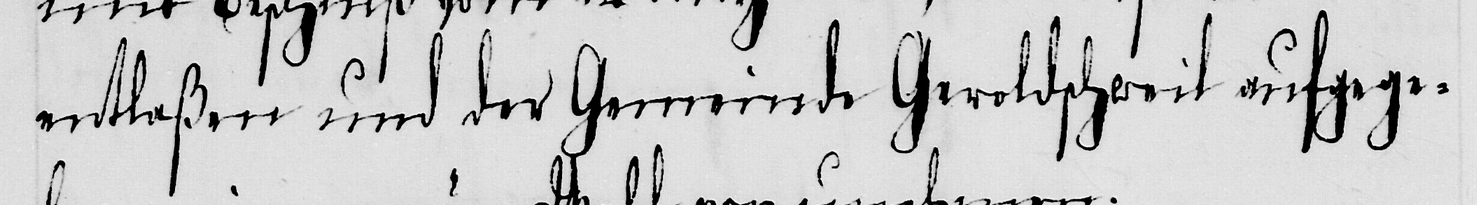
entlaßen und der Gemeinde Geroldschweil aufgege¬
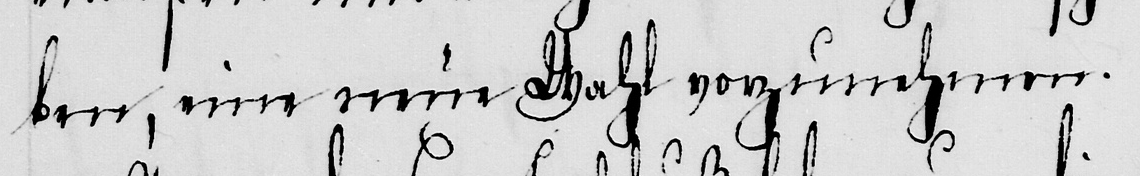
ben, eine neue Wahl vorzunehmen.
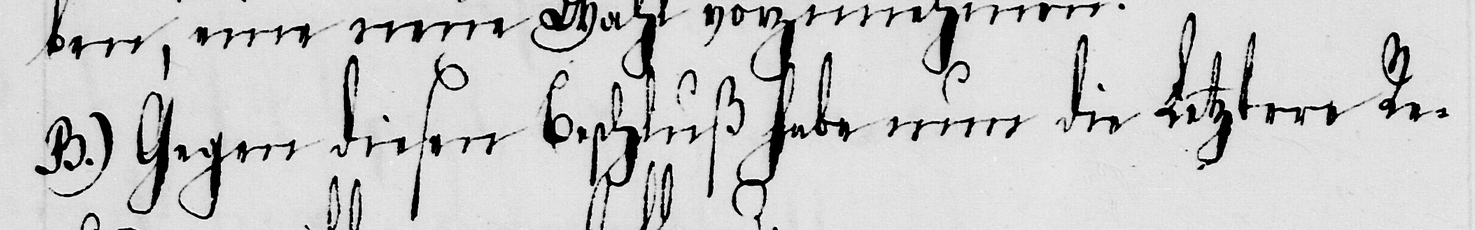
B.) Gegen diesen Beschluß habe nun die Letztere Re¬
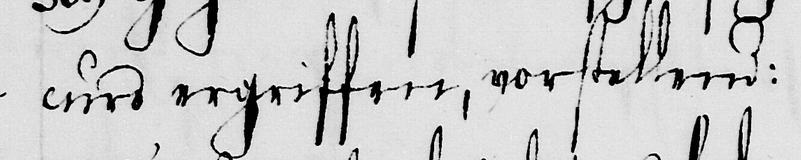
curs ergriffen, vorstellend:
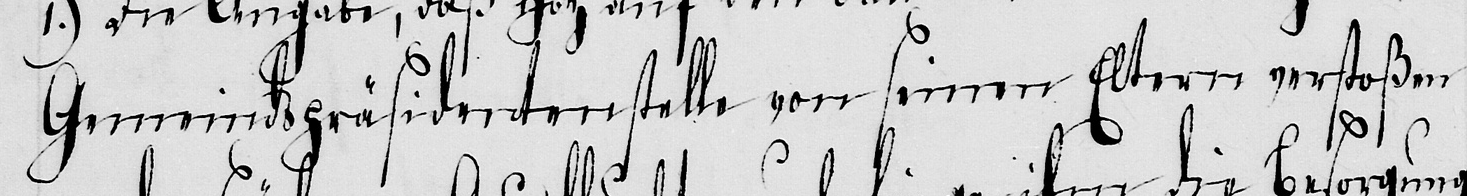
Gemeindspräsidentenstelle von seinen Eltern verstoßen
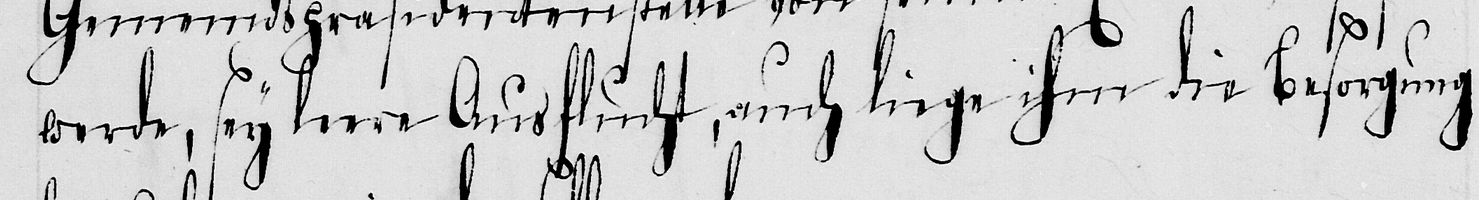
werde, sey leere Ausflucht, auch liege ihm die Besorgung
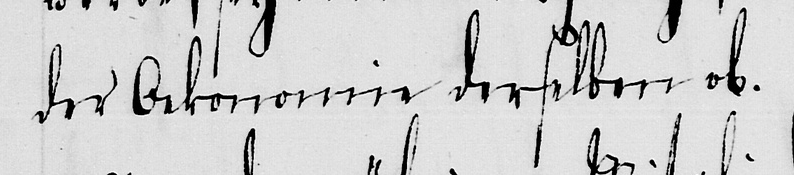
der Oekonomie derselben ob.
